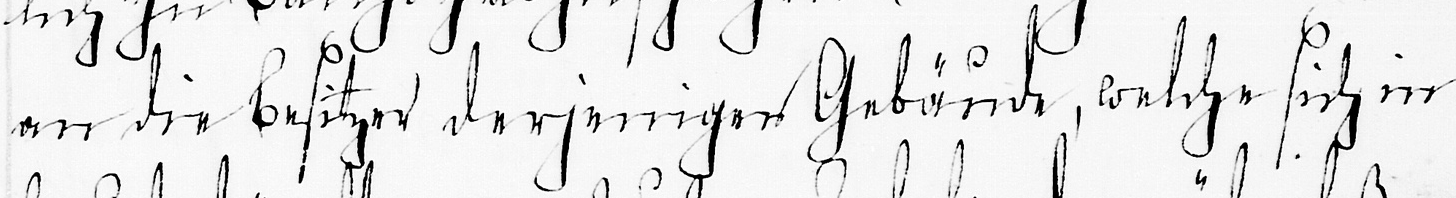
an die Besitzer derjenigen Gebäude, welche sich in
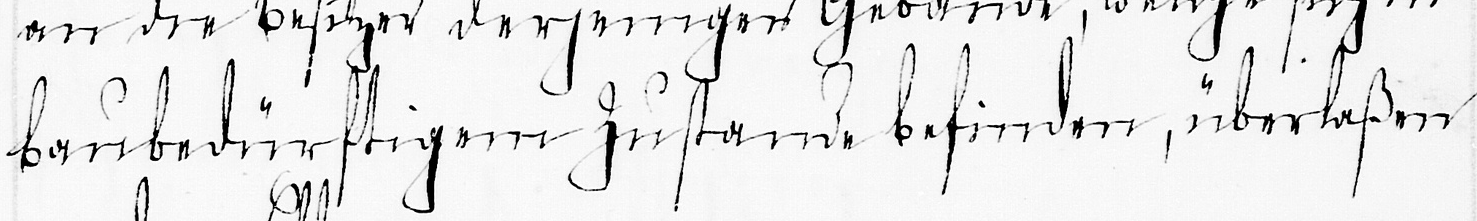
baubedürftigem Zustande befinden, überlaßen
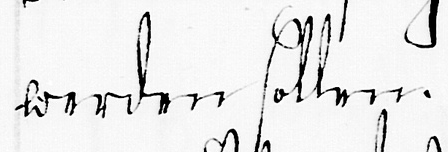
werden sollen.
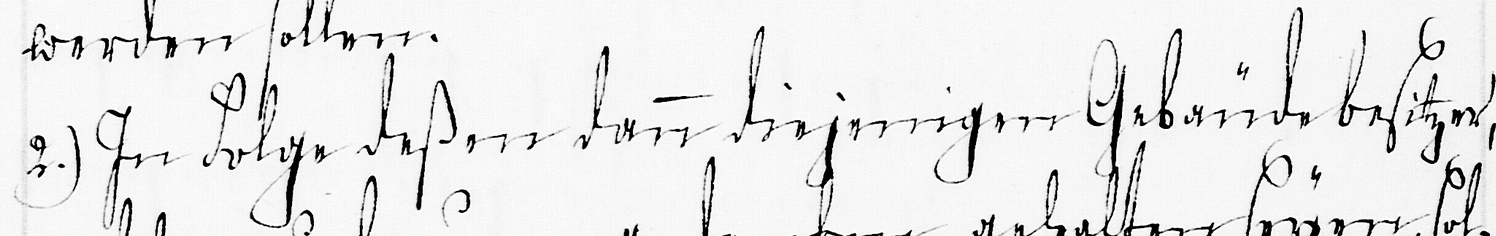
2.) In Folge deßen dann diejenigen Gebäudebesitze¬
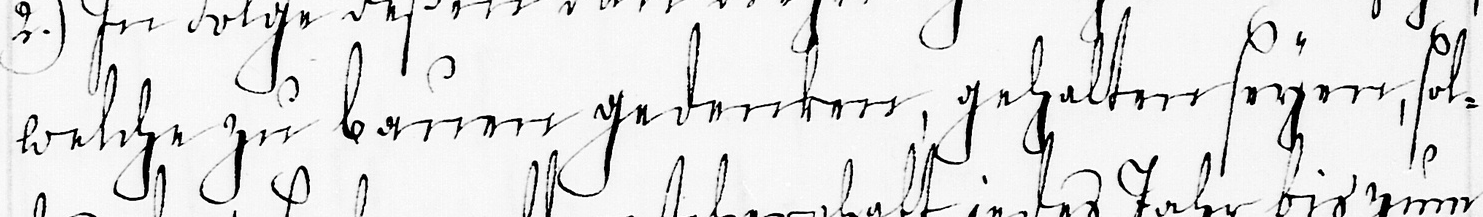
welche zu bauen gedenken, gehalten seyen, sol¬
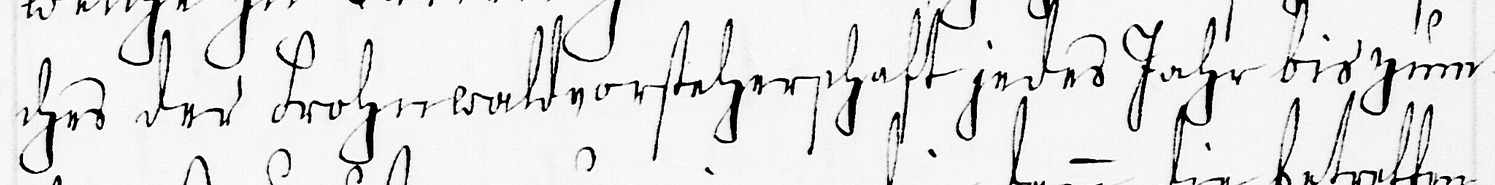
ches der Frohnwaldvorsteherschaft jedes Jahr bis zum
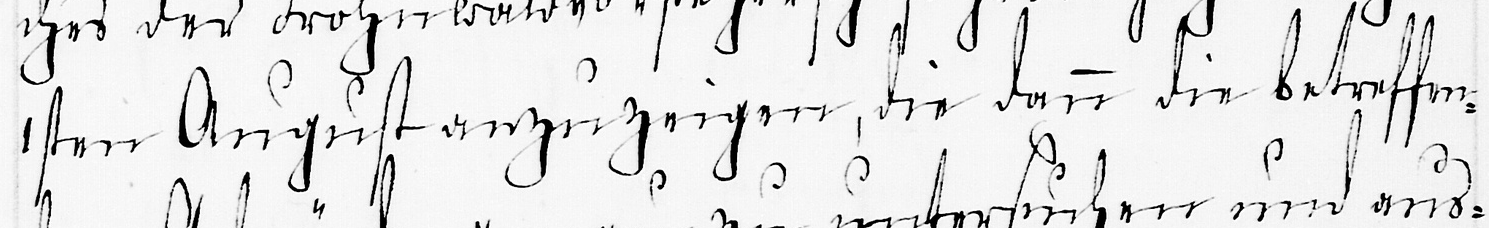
1sten August anzuzeigen, die dann die betreffen¬
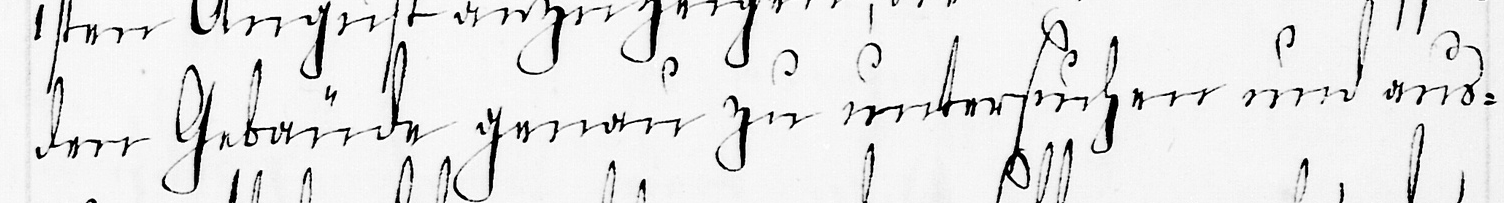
den Gebäude genau zu untersuchen und aus¬
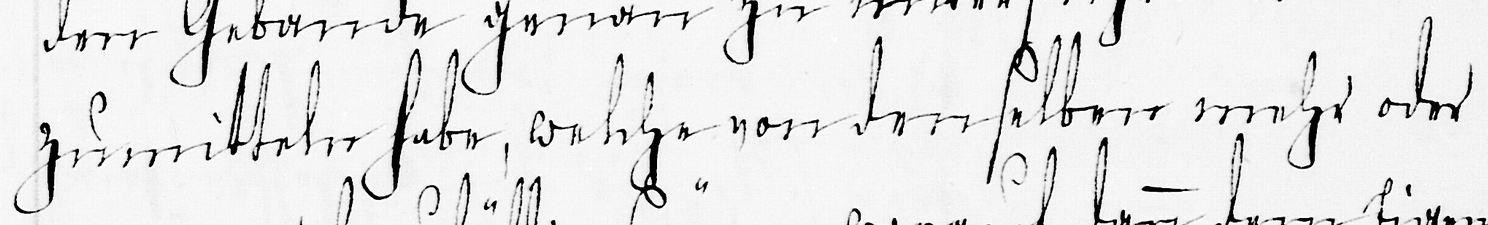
zumitteln habe, welche von denselben mehr oder
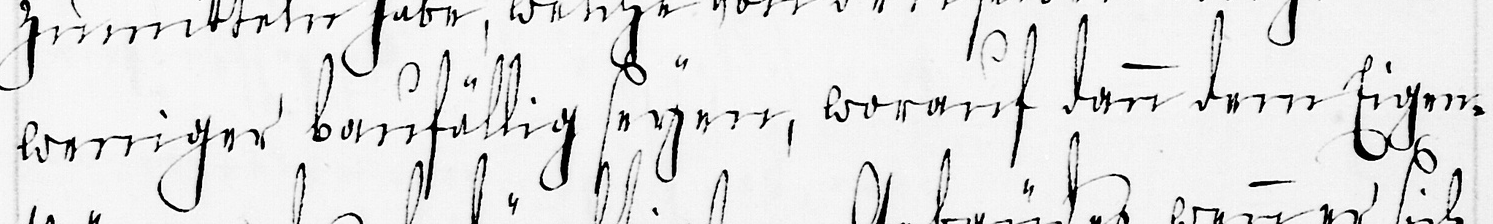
weniger baufällig seyen, worauf dann dem Eigen¬
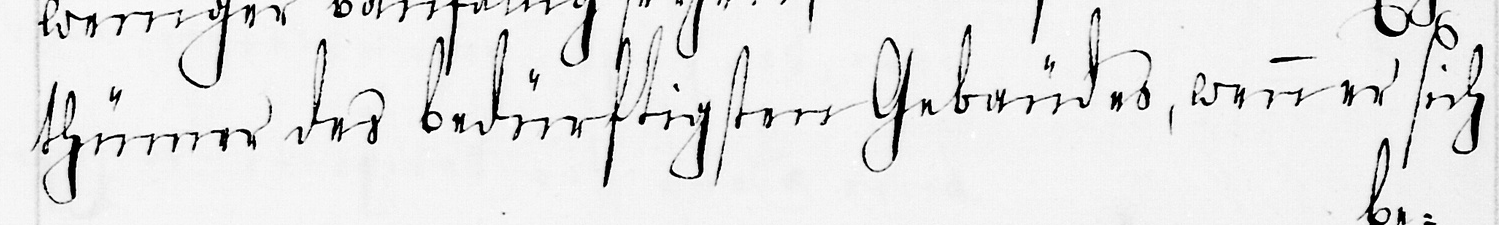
thümer des bedürftigsten Gebäudes, wenn er sich
